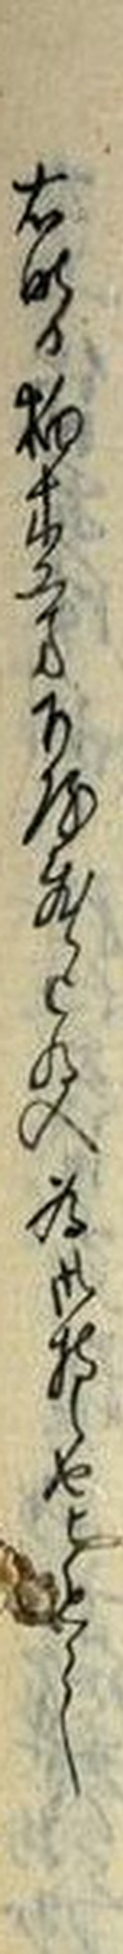右昨日狛木工方屋敷へ被為入為御持候由被進之
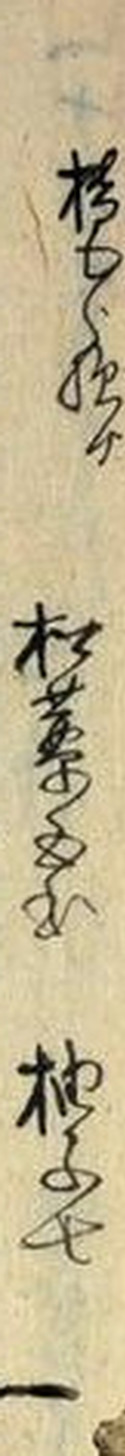揩五郎様ゟ松蕈五本柚子七
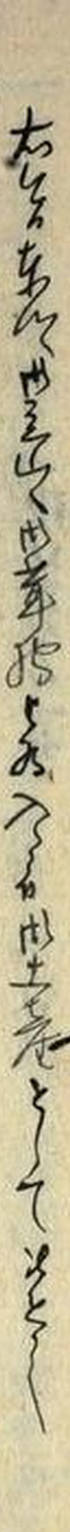右今日東郷御立山へ御茸狩被為入候ニ付御土産として被進之
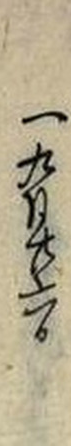一九月廿六日
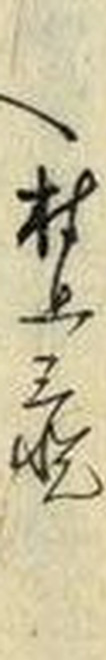村上三悦
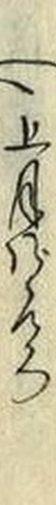上月八郎左衛門
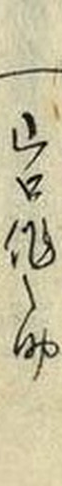山口作之助
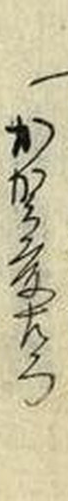加賀藤左衛門
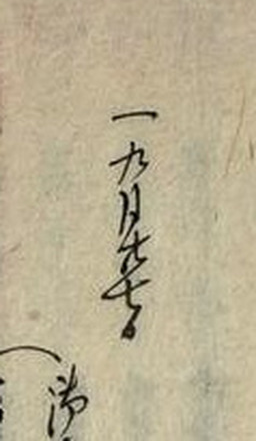一九月廿七日
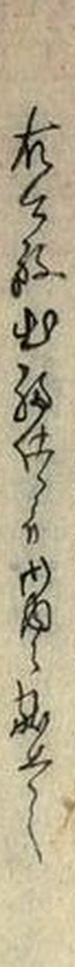右今般出福仕候付御内々献上之
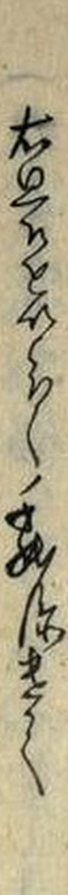右思召を以被下之手紙添遣之

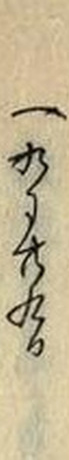一九月廿九日
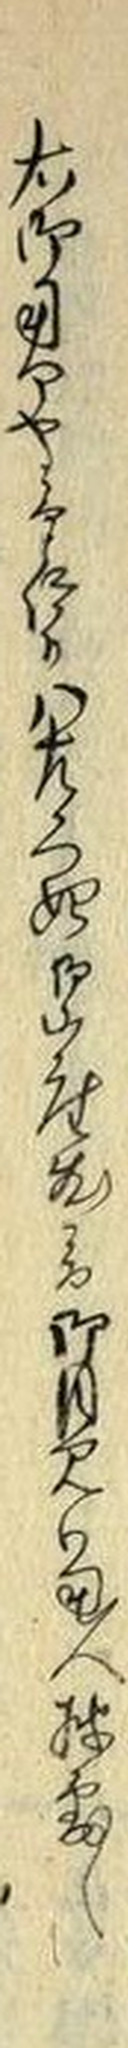右御用部やニ而被仰付八左衛門始御小座敷ニ而御目見御用人披露之
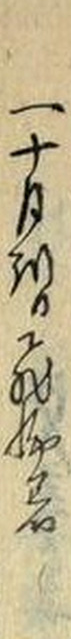一十月朔日飛脚着
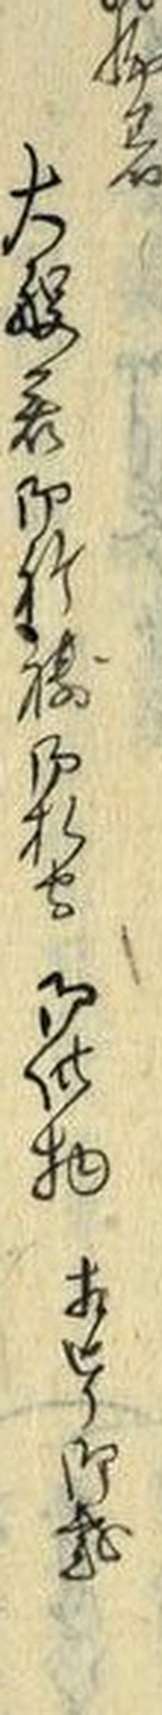大般若御祈祷御札守御供物相廻り御戴
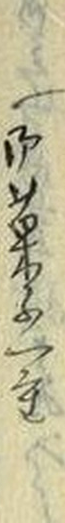御菓子一重
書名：少傅日録抄（斉承付側向頭取日記、在国）
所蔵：福井県文書館 Fukui Prefectural Archives
